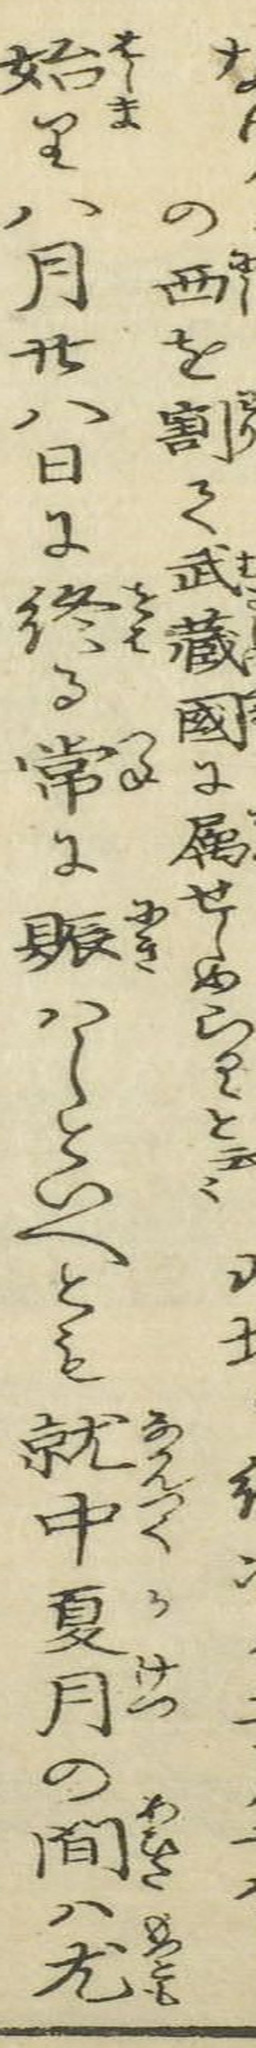始り八月廿八日に終る常に賑はしといへとも就中夏月の間は尤
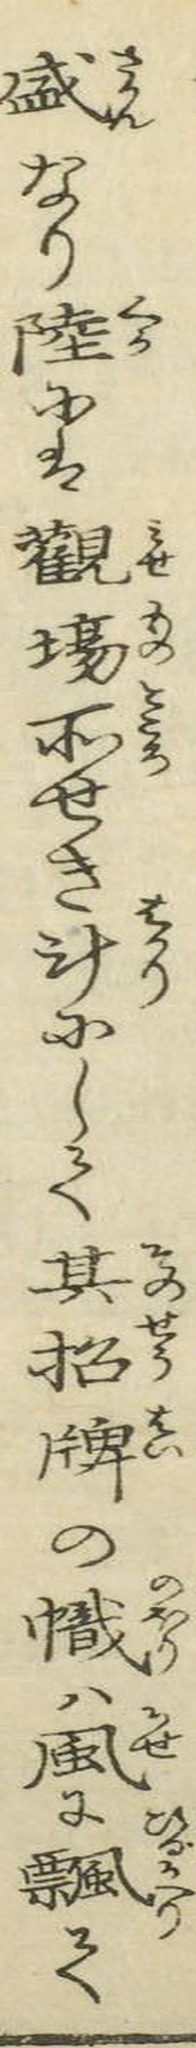盛なり陸には観場所せき斗にして其招牌の幟は風に飄て
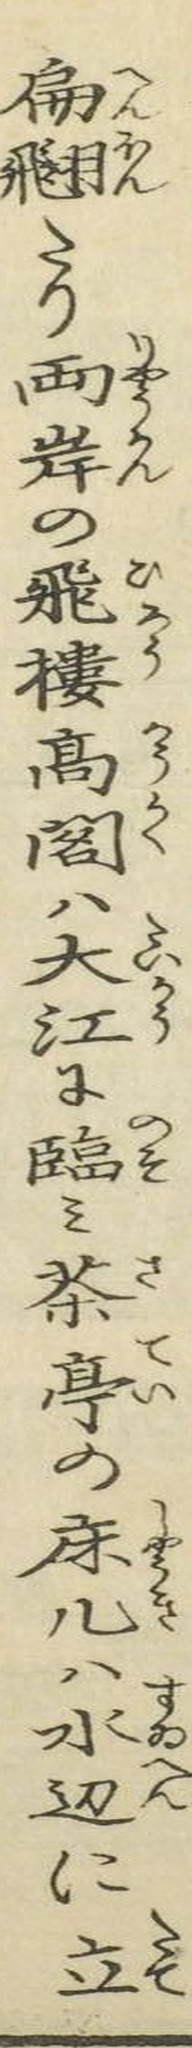扁翻たり両岸の飛楼高閣は大江に臨み茶亭の床几は水辺に立
